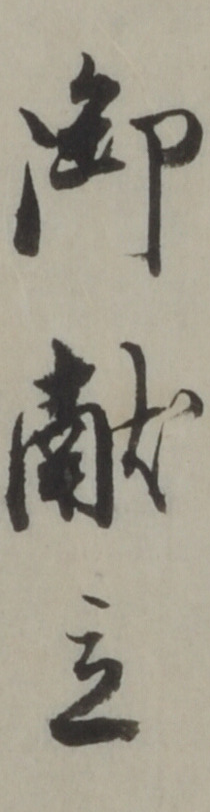御献立
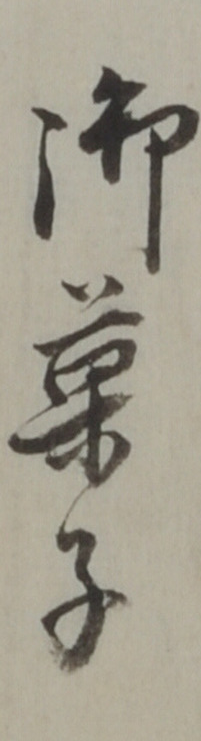御菓子
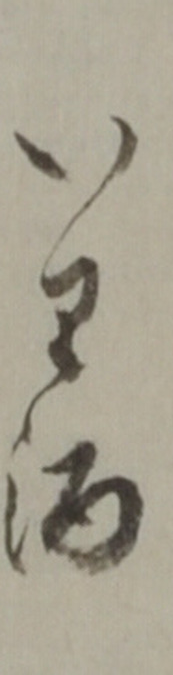いり酒
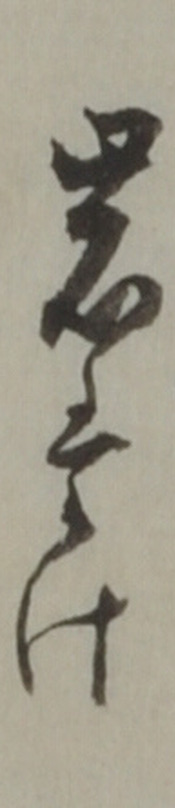岩たけ
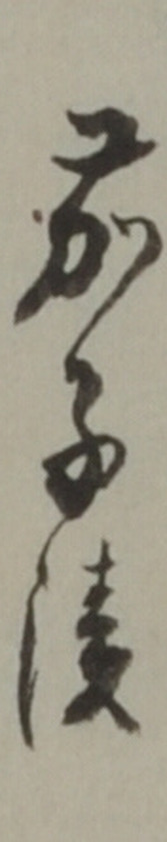茄子漬
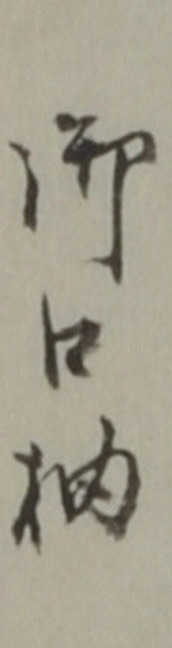御口柚
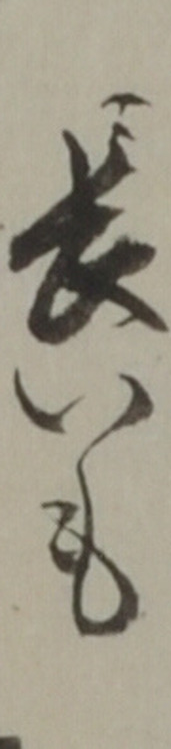長いも
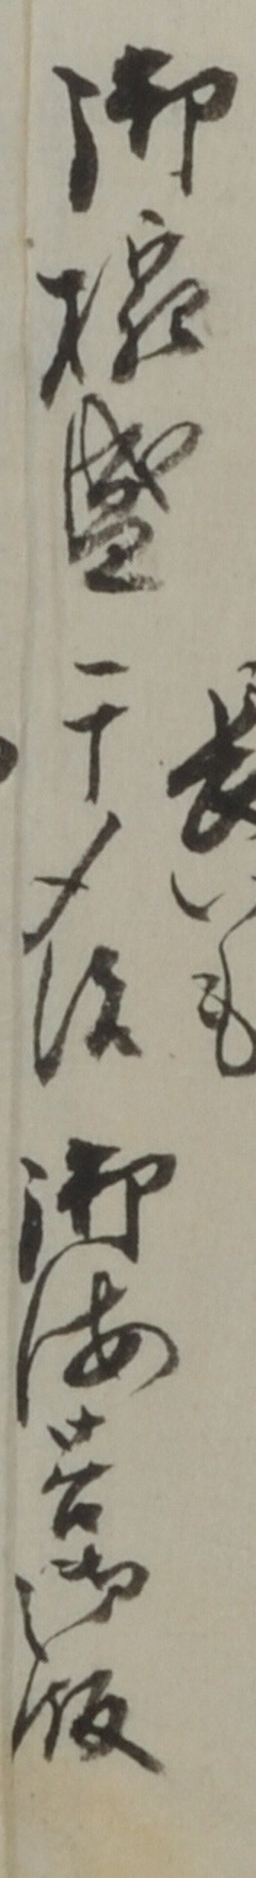御碗盛干〆治御海苔御飯
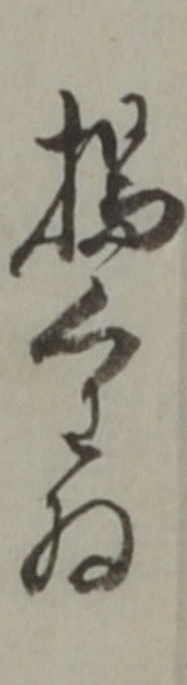揚くわゐ
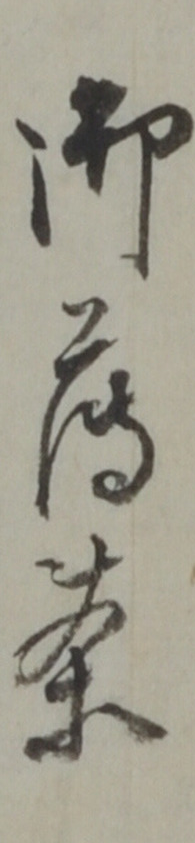御薄茶
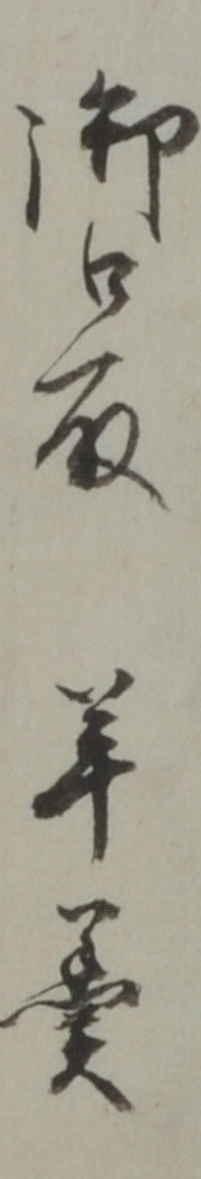御口取羊羹

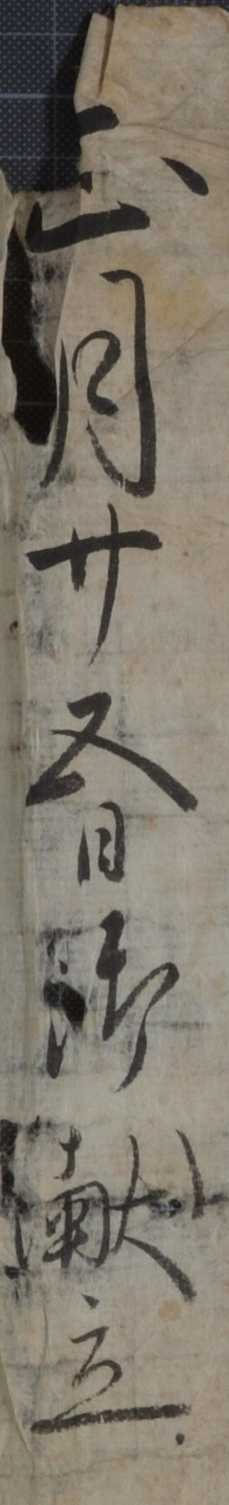三月五日御献立
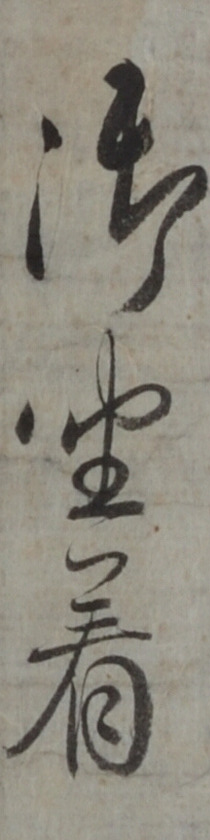御座着
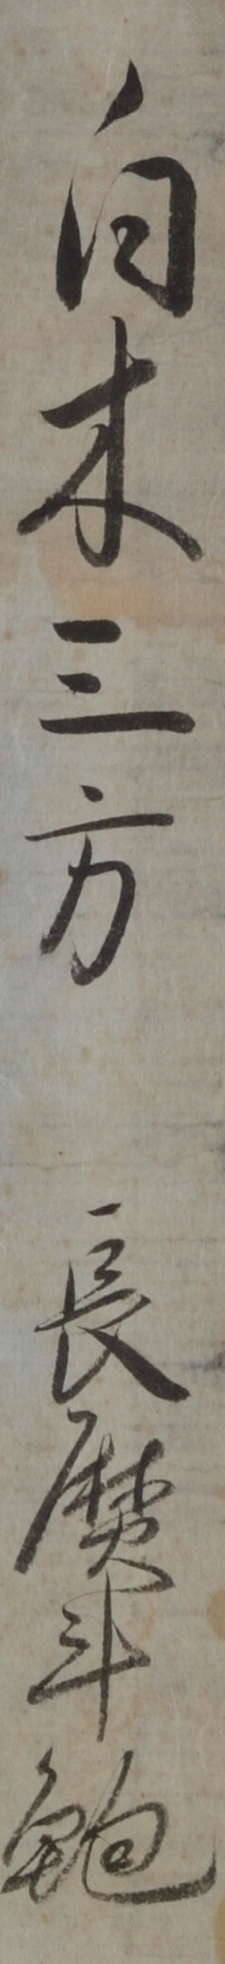白木三方長熨斗鮑
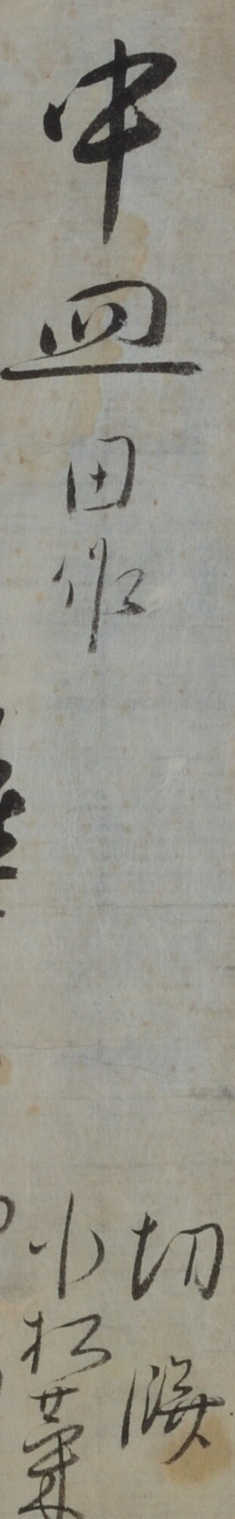中皿田作小松菜
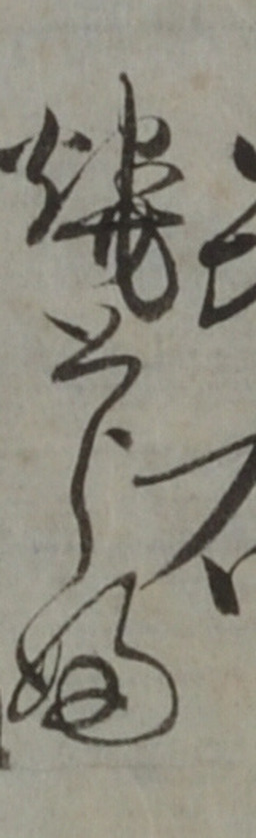焼とうふ
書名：献立書上
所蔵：伊那市立高遠町図書館・合同会社AMANE
